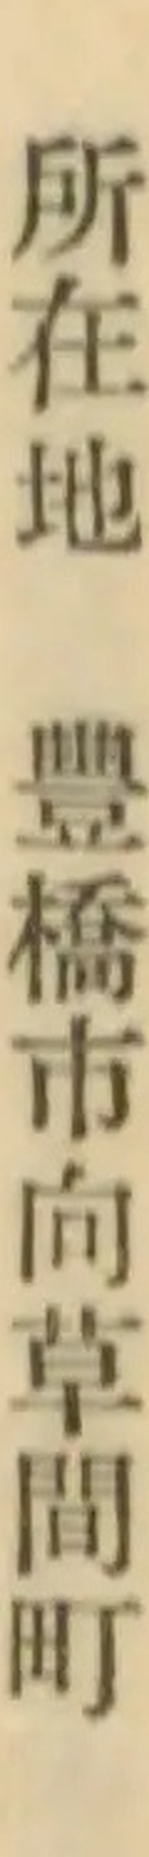所在地豊橋市向草間町
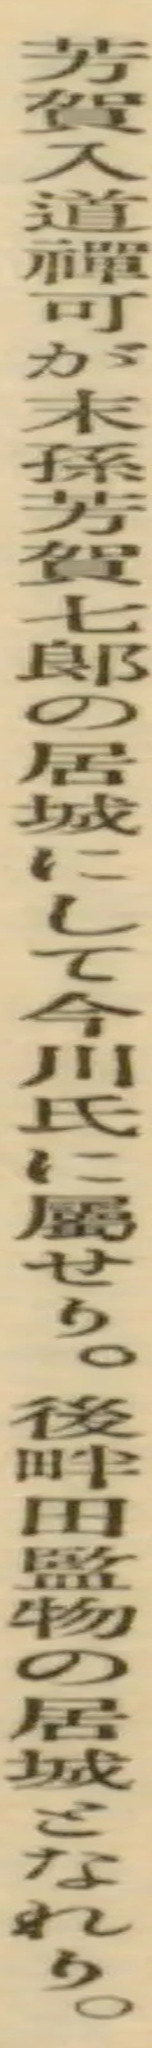芳賀入道禅可が末孫芳賀七郎の居城にして今川氏に属せり。後畔田監物の居城となれり。
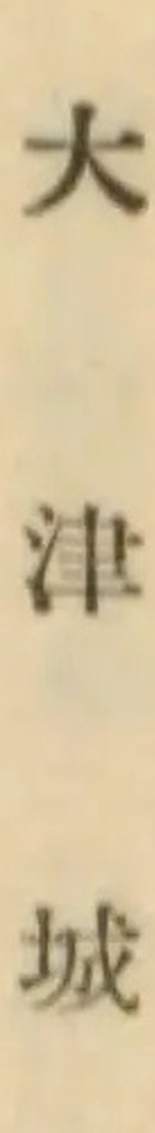大津城
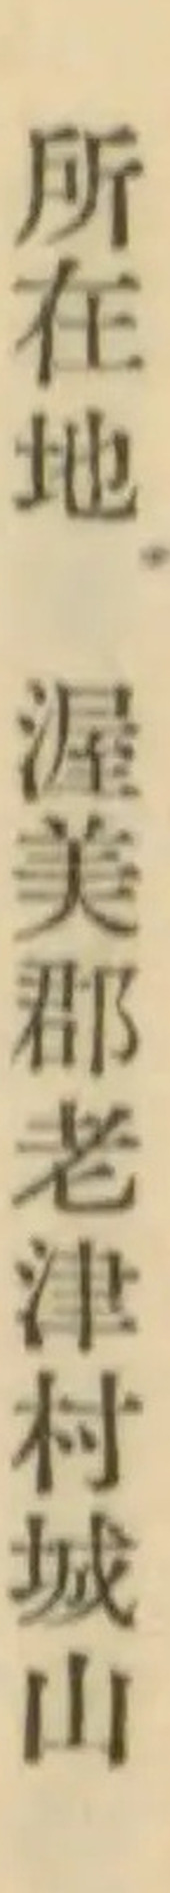所在地渥美郡老津村城山
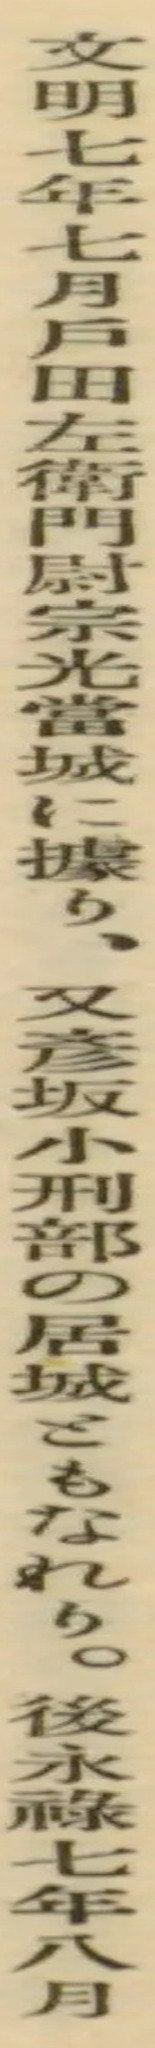文明七年七月戸田左衛門尉宗光当城に拠り、又彦坂小刑部の居城ともなれり。後永禄七年八月
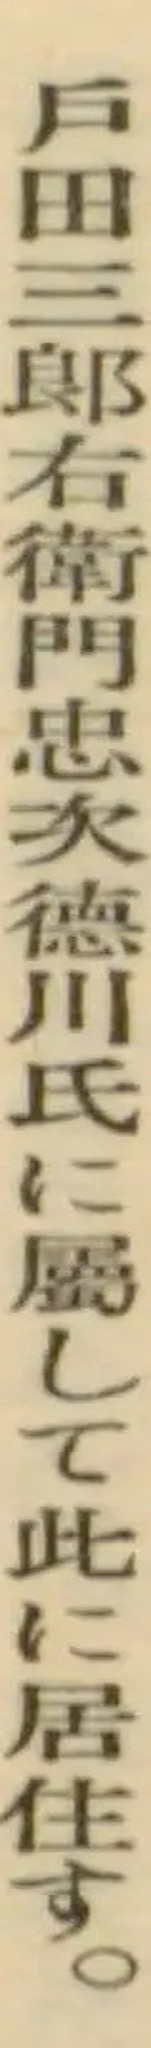戸田三郎右衛門忠次徳川徳川氏に属して此に居住す。
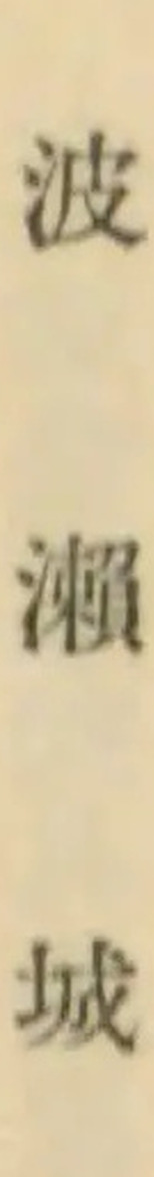波瀬城
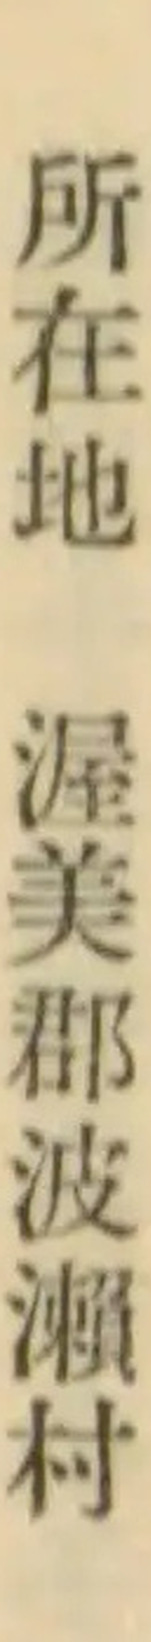所在地渥美郡波瀬村
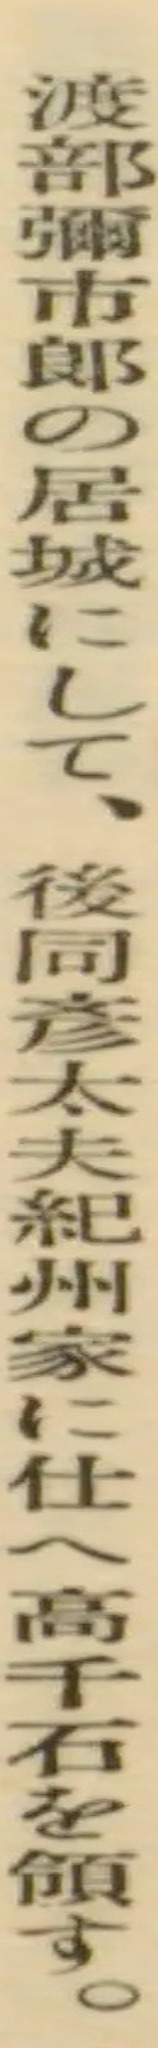渡部弥市郎の居城にして、後同彦太夫紀州家に仕へ高千石を領す。
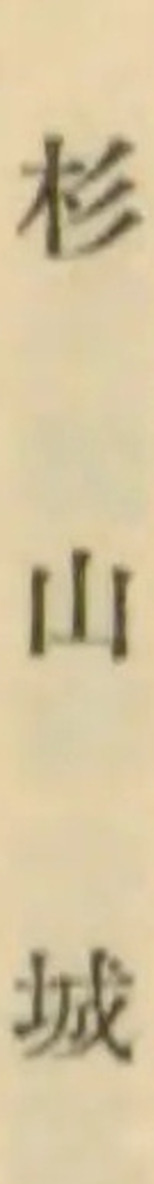杉山城
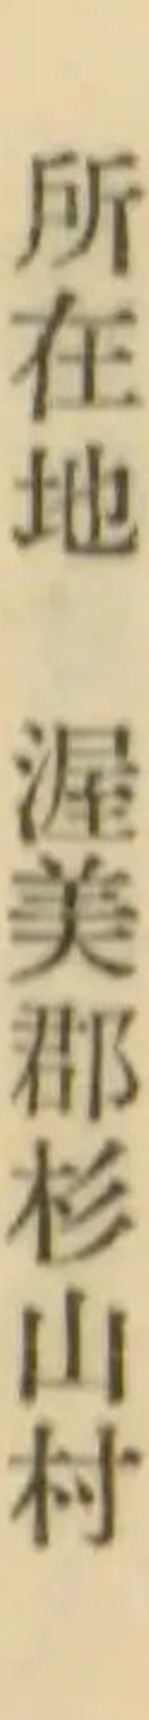所在地渥美郡杉山村
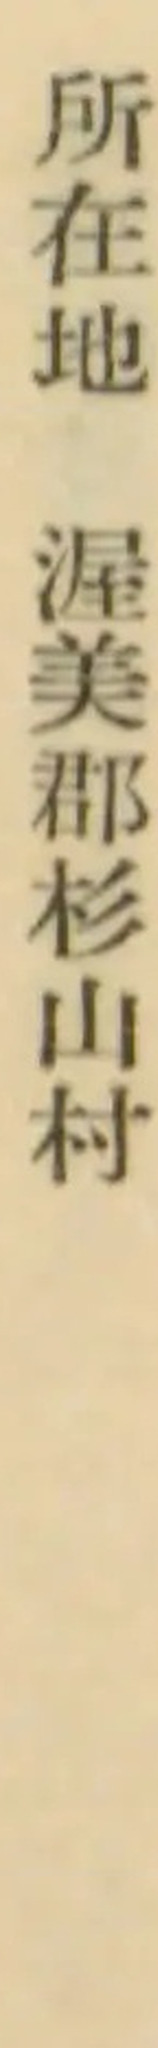所在地渥美郡杉山村
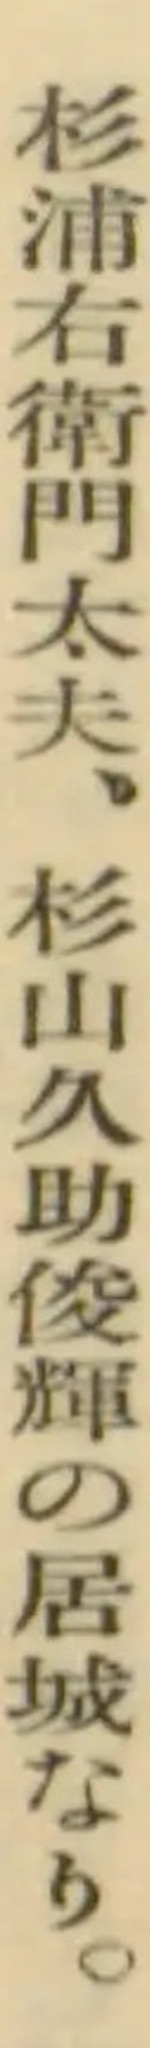杉浦右衛門太夫、杉山久助俊輝の居城なり。
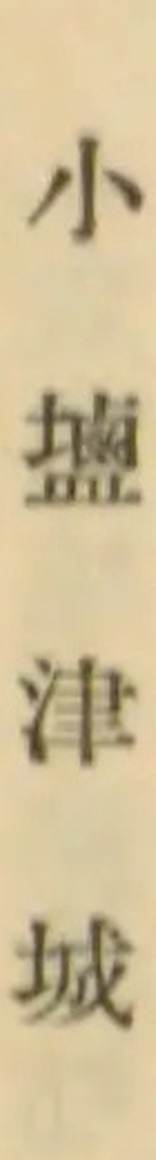小塩津城

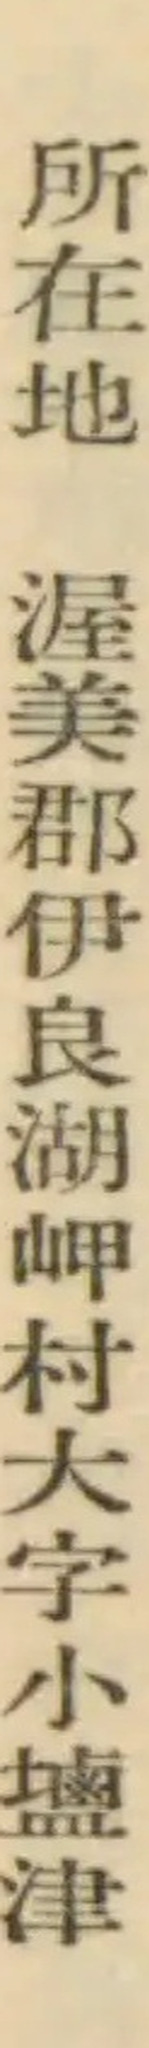所在地渥美郡伊良湖岬村大字小塩津
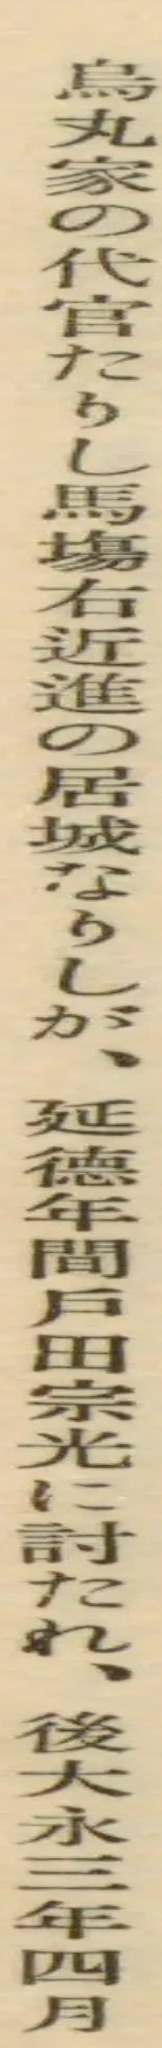烏丸家の代官たりし馬塲右近進の居城なりしが、延徳年間戸田宗光に討たれ、後大永三年四月
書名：東三河之古城
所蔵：国立国会図書館 National Diet Library, JAPAN
